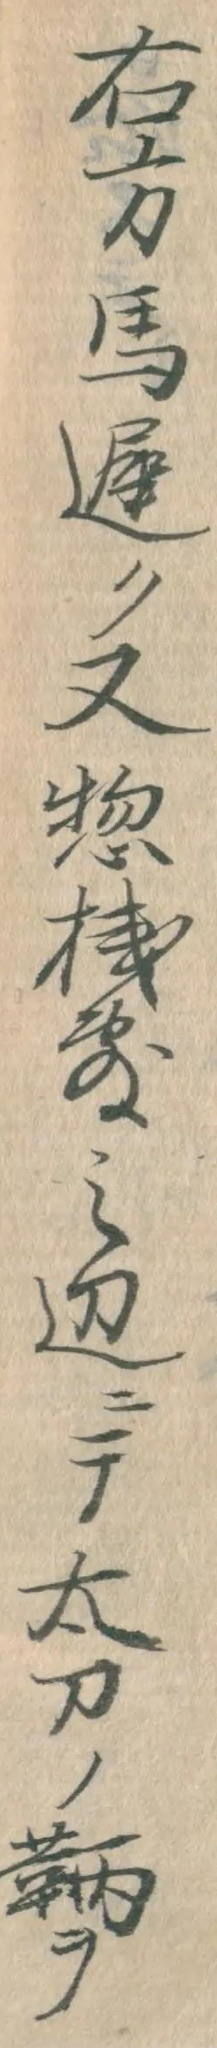右方馬遅ク又惣桟敷之辺ニテ太刀ノ鞆ヲ

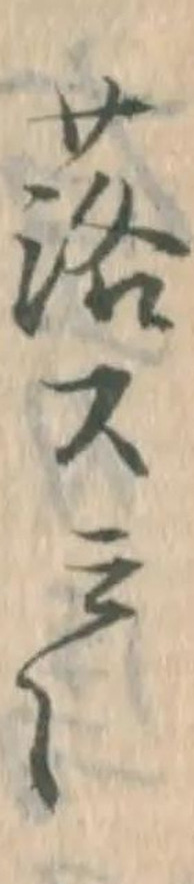落ス云々
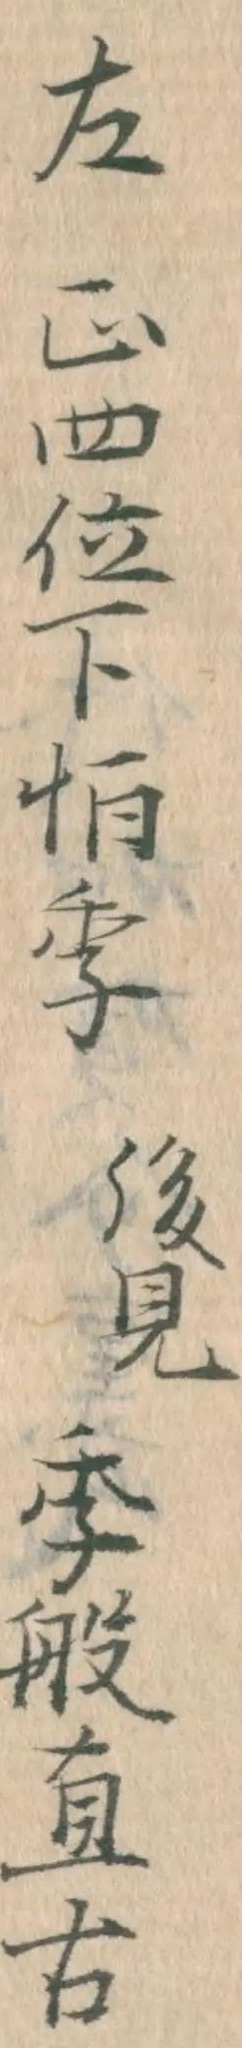左正四位下恒季後見季般直古
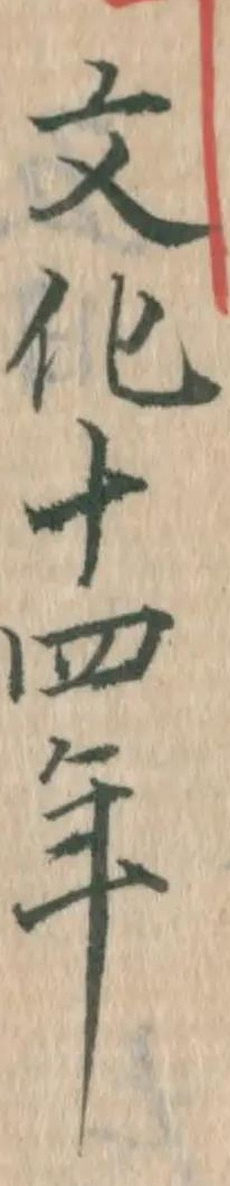文化十四年
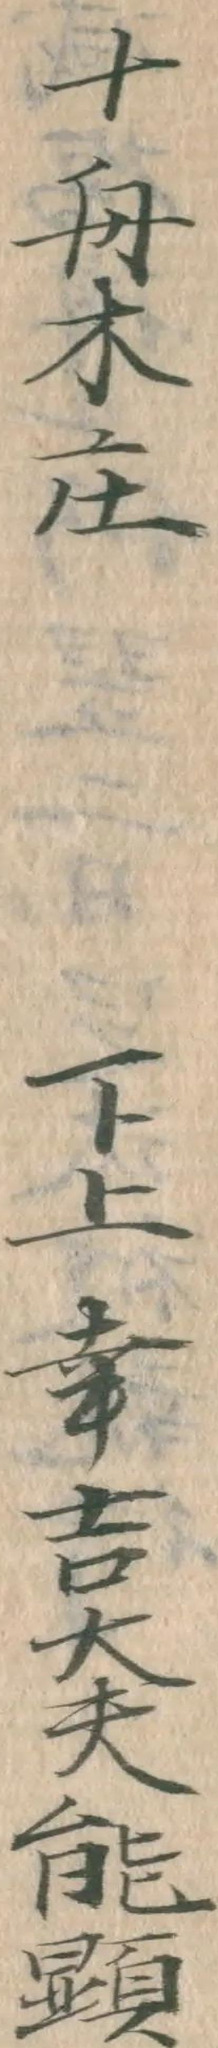十舟木庄下上幸吉大夫能顕
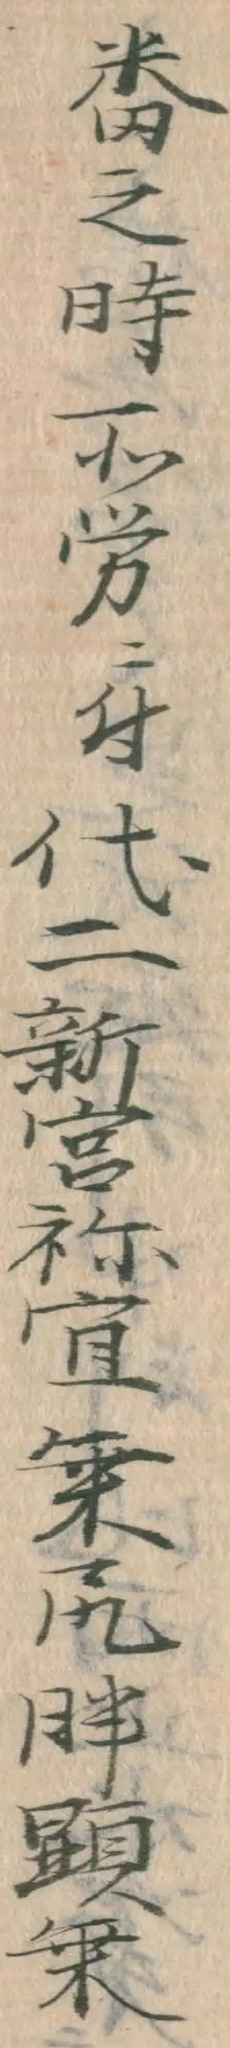番之時所労ニ付代二新宮祢宜乗尻胖顕乗
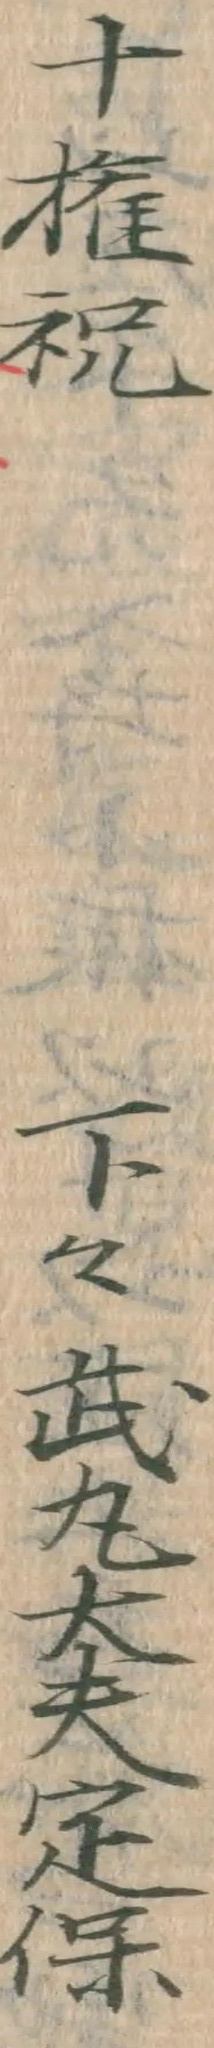十権祝下々武丸大夫定保
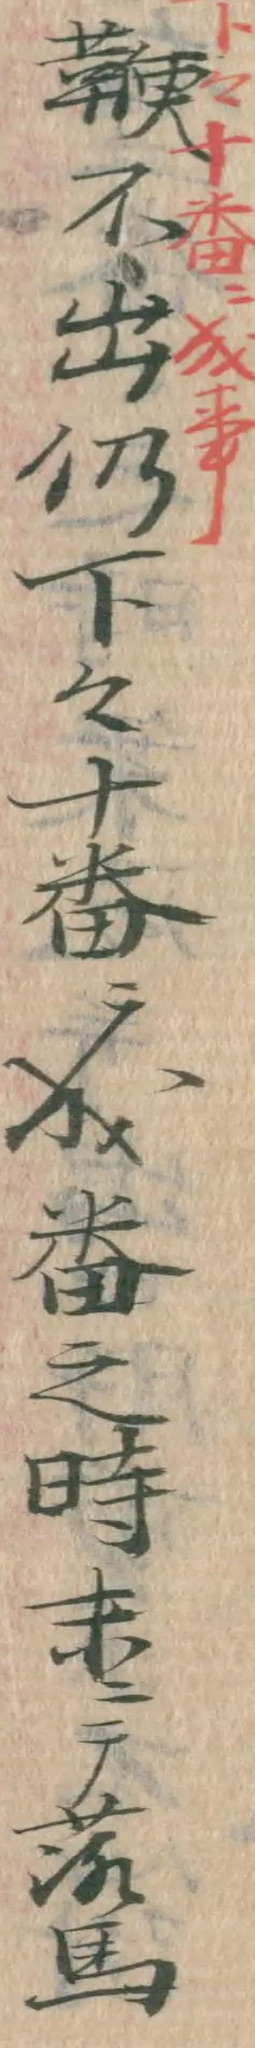鞭不出仍下々十番ニ成番之時末ニテ落馬
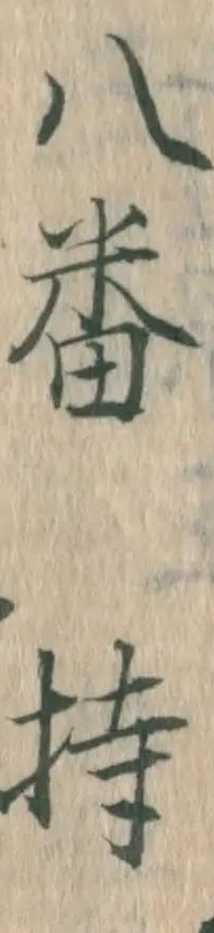八番持
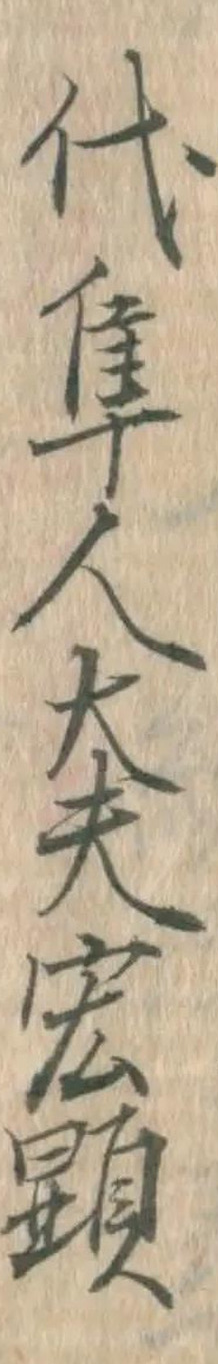代隼人大夫宏顕
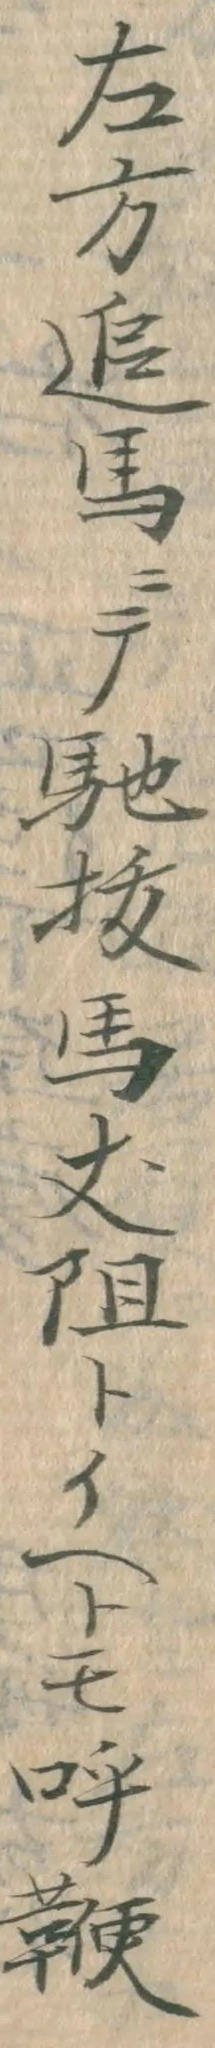左方追馬ニテ馳抜馬丈阻トイヘトモ呼鞭
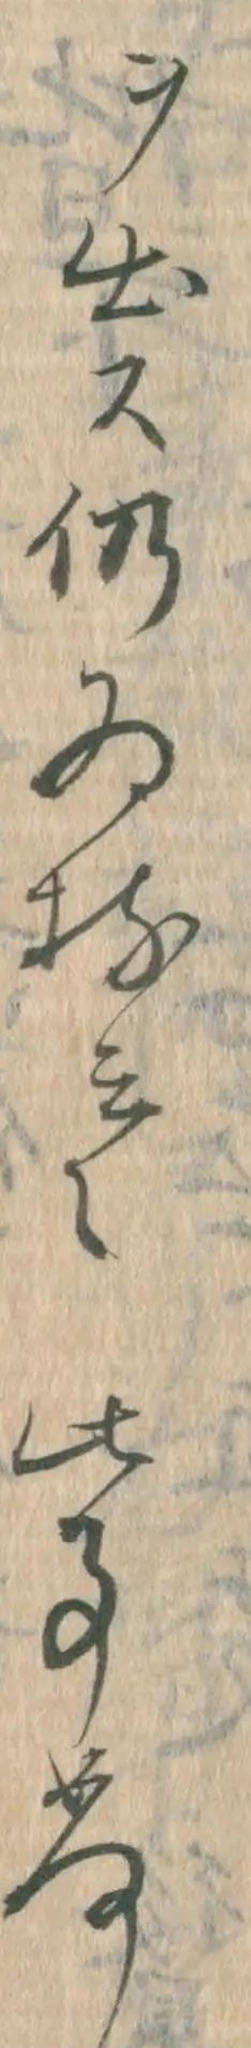ヲ出ス仍為持云々此事如何

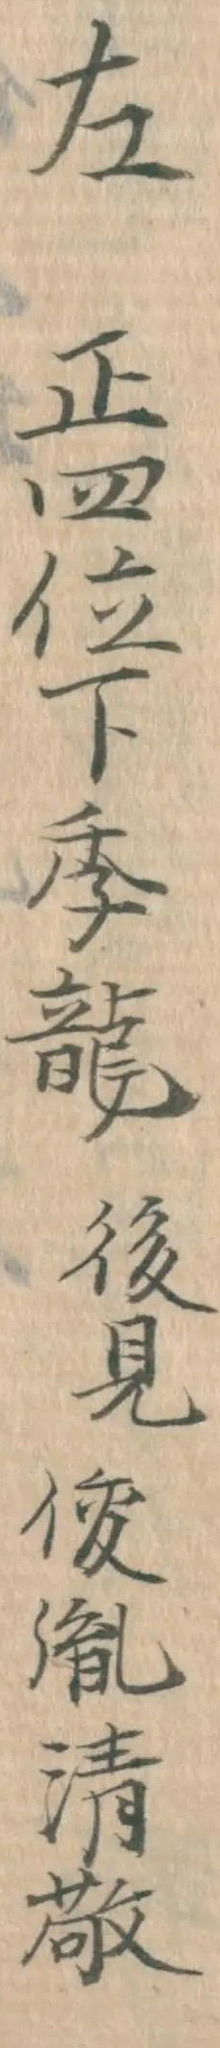左正四位下季龍後見俊胤清敬
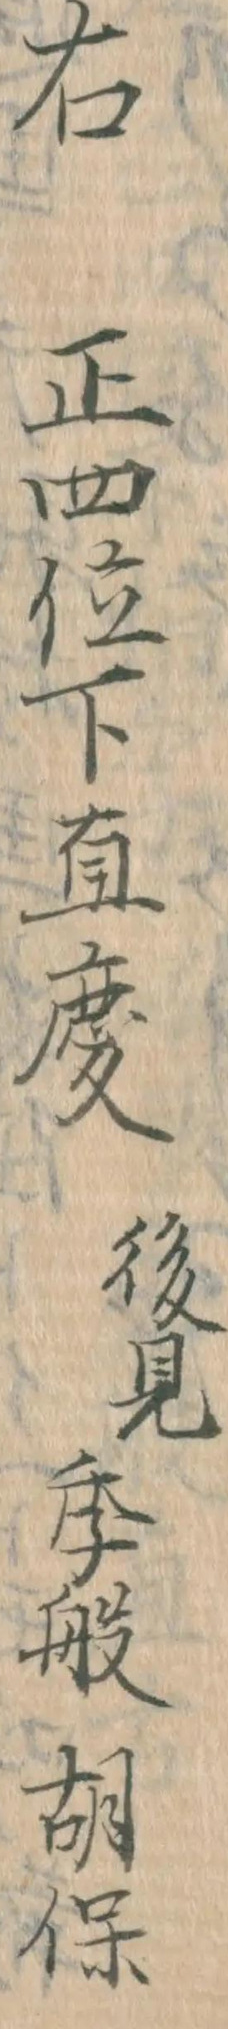右正四位下直慶後見季般胡保
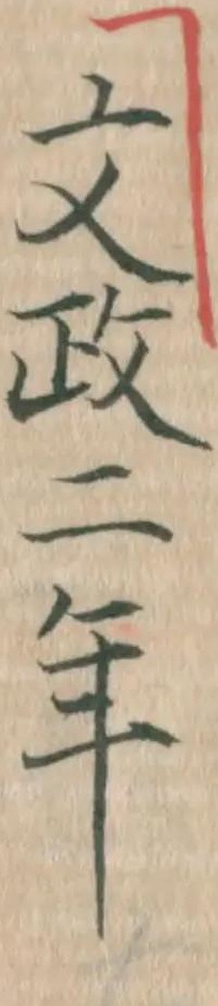文政二年
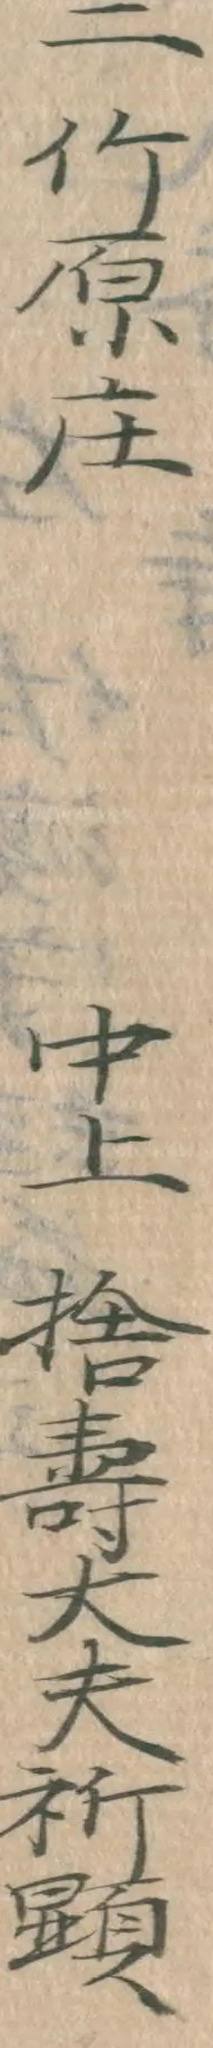二竹原庄中上捨寿大夫祈顕
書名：賀茂社記録. 第10冊
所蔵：国立国会図書館 National Diet Library, JAPAN
